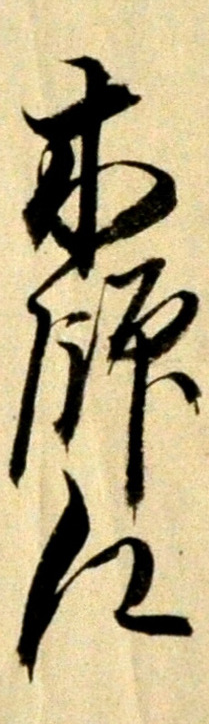木師郷
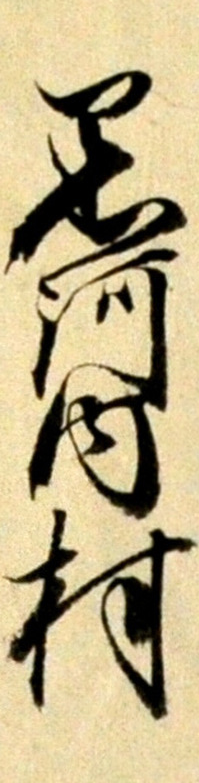黒河内村
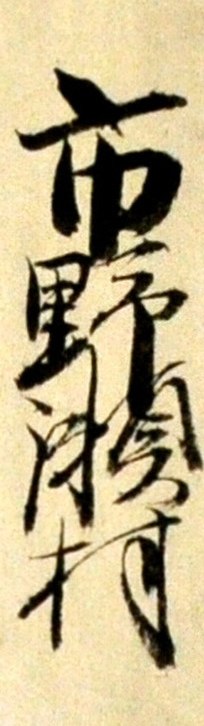市野瀬村
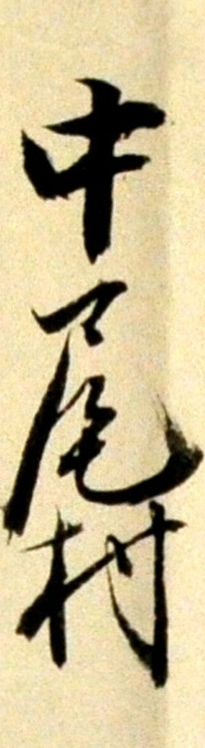中尾村
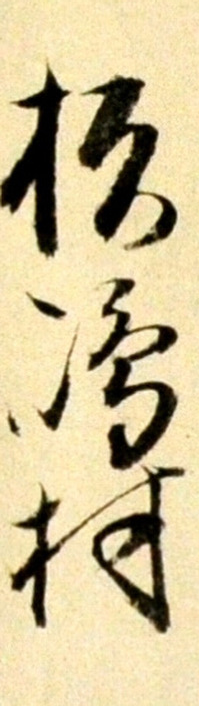杉嶋村
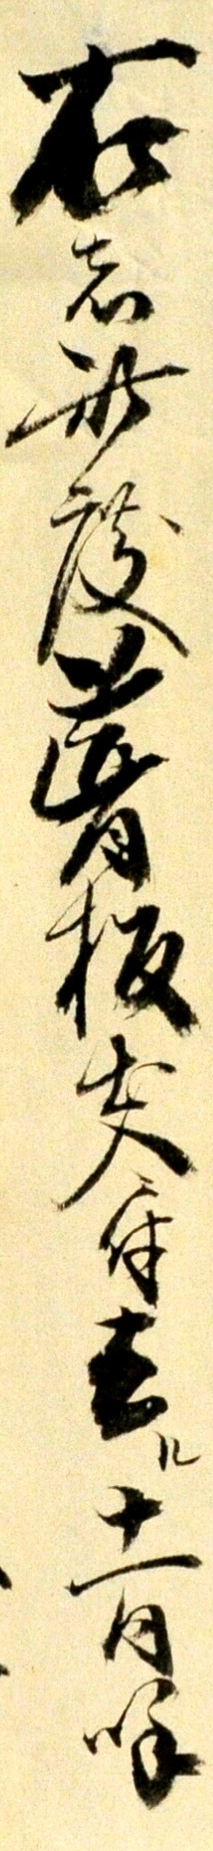右者此度葺板出入ニ付去ル十一月呼
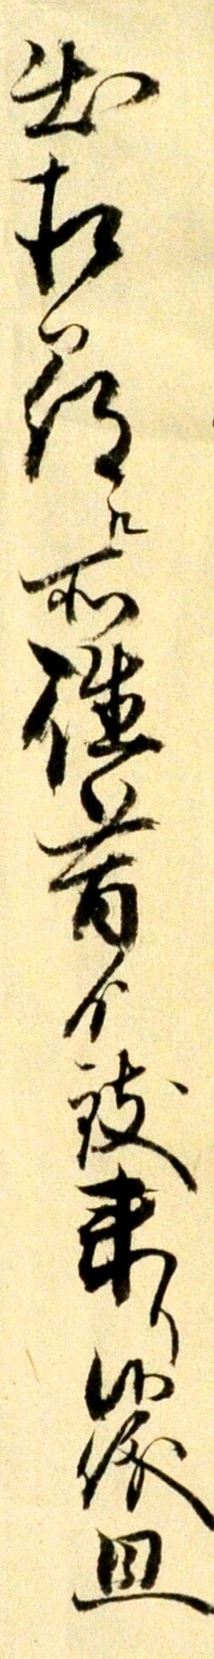出相尋ル所往昔ゟ致来り候儀且
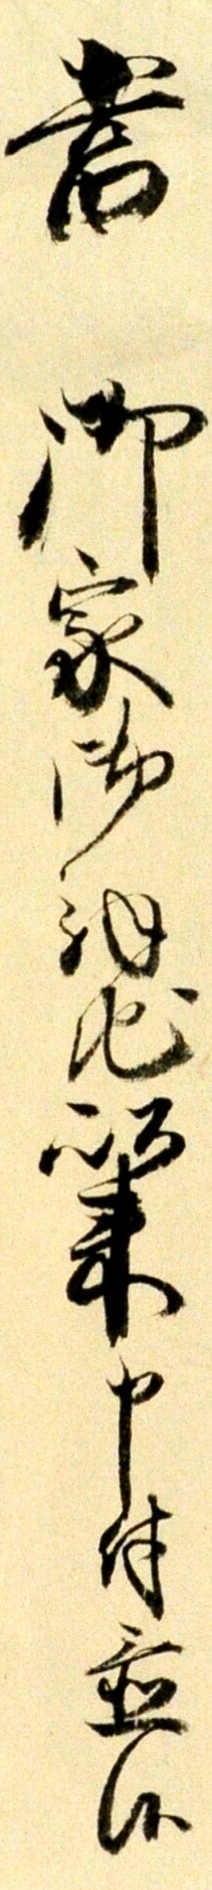当御家御拝地以来申付置候
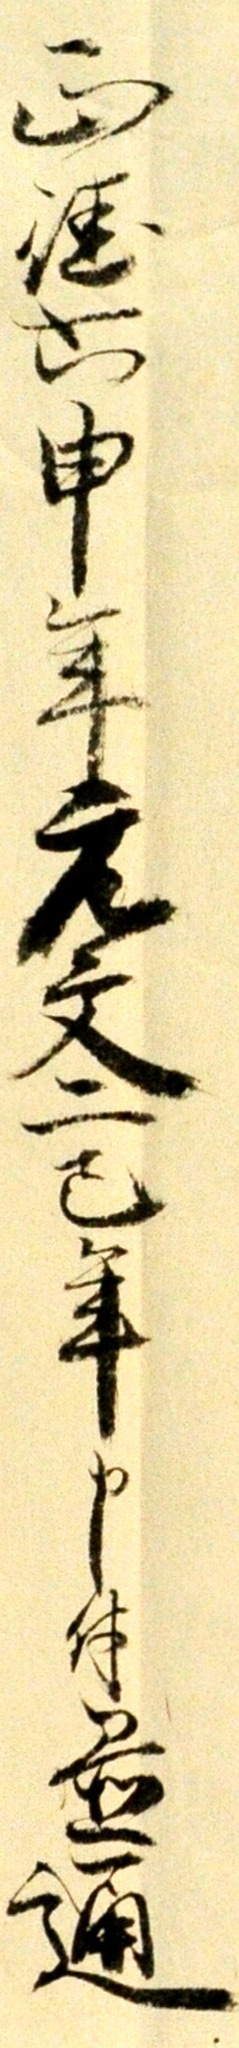正徳六申年元文二巳年申付置通
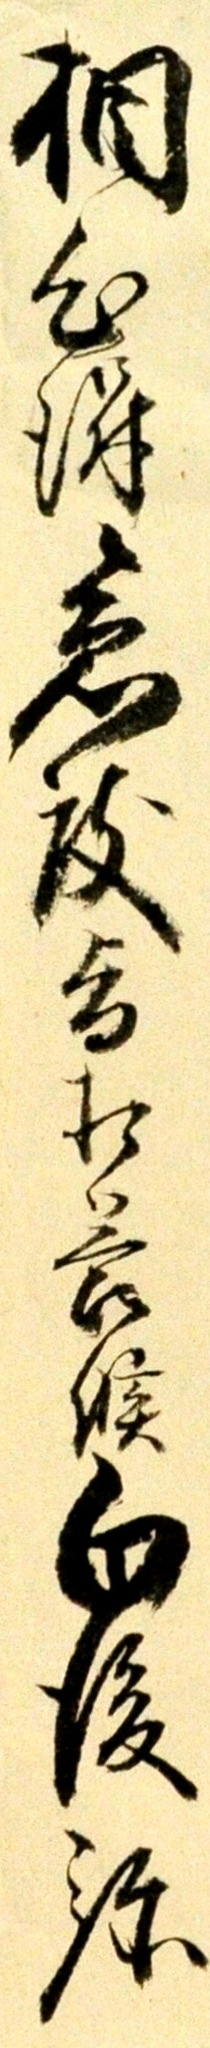相心得急度旨相答候向後弥
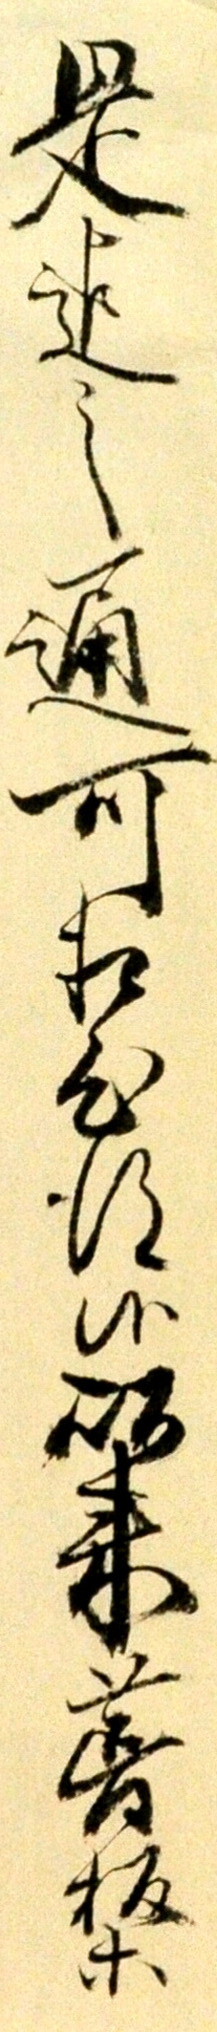是迄之通可相心得候以来葺板等
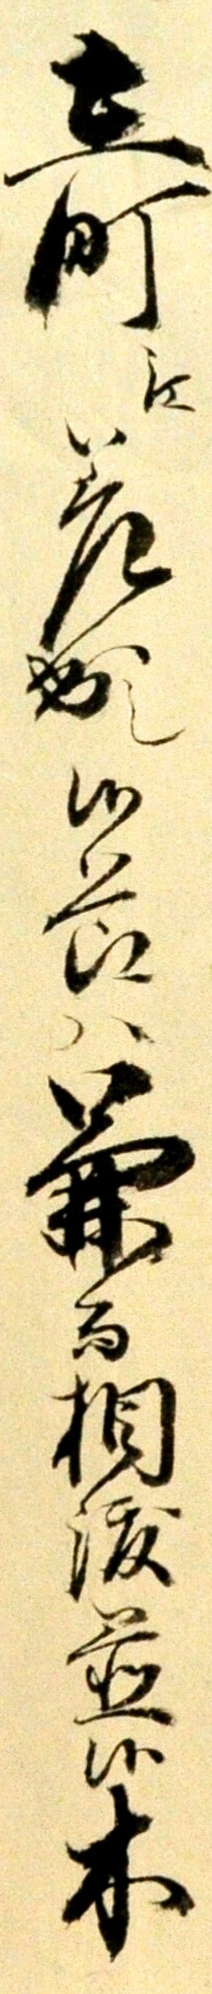在町江差出シ候節ハ兼而相渡置候木
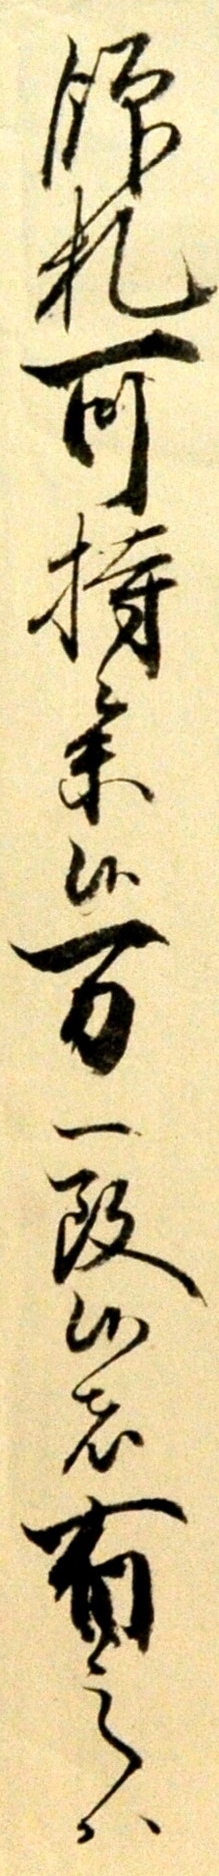師札可持参候万一改候者有之ハ
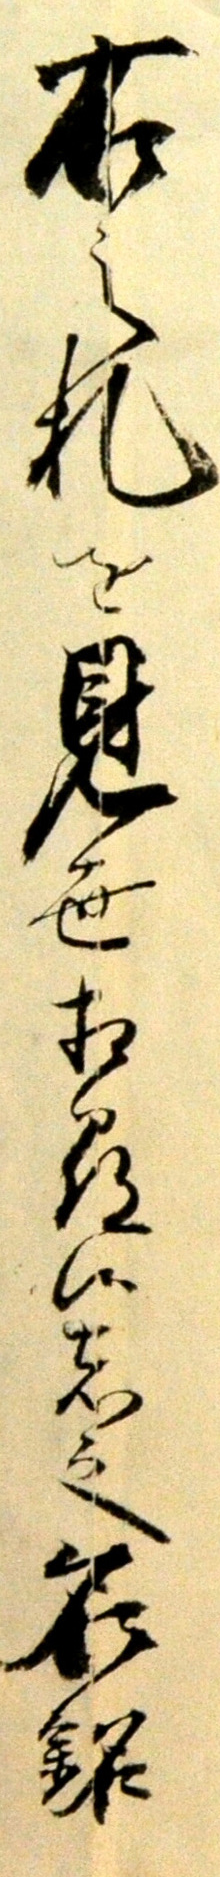右之札を見せ相尋候者之名銘

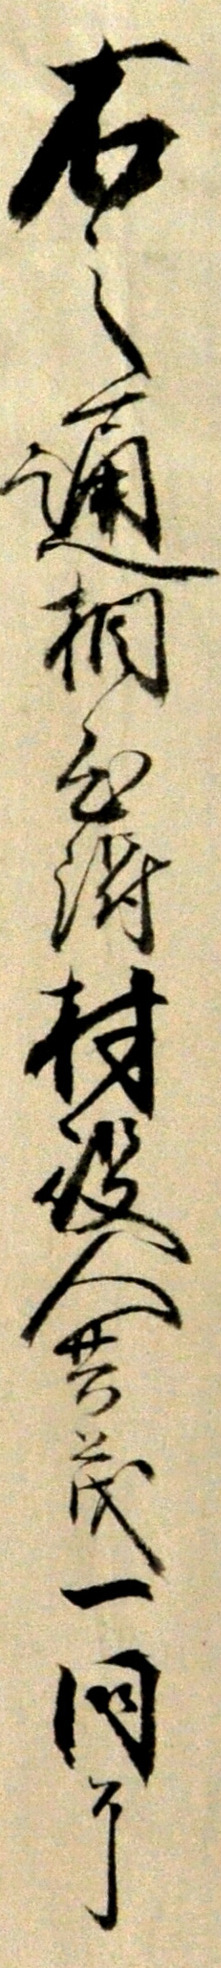右之通相心得村役人共茂一同に
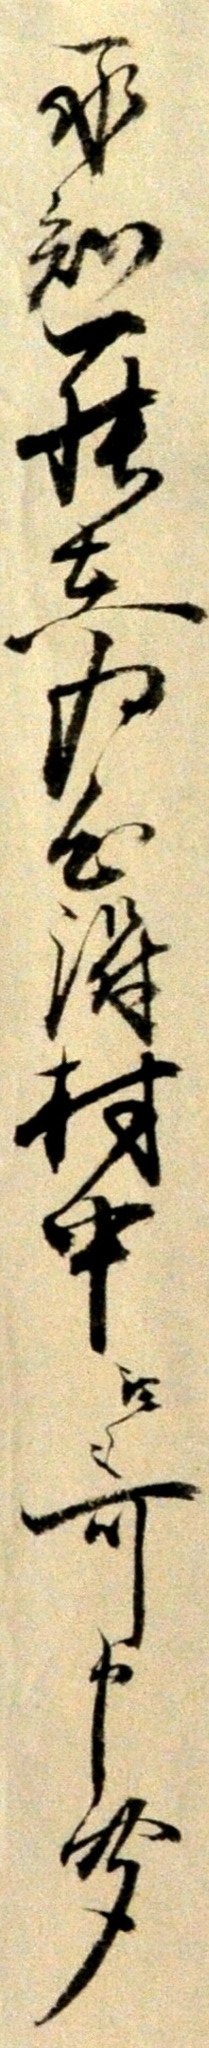承知罷在為心得村中江も可申聞
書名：木師郷御定書（写）
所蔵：伊那市立高遠町図書館・合同会社AMANE
